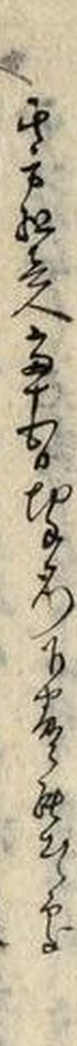其方組壱人当十五日切手御門下番罷出候処
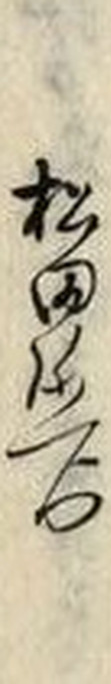松田弥一右衛門
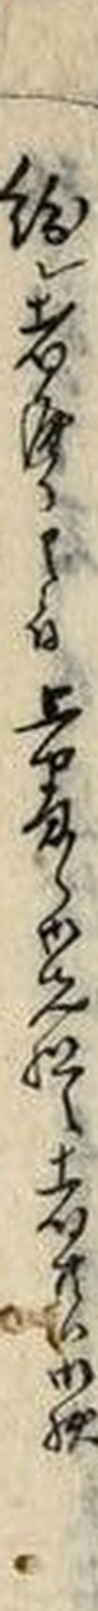紛レ者通り申ニ付上番之御先組之者共は御扶

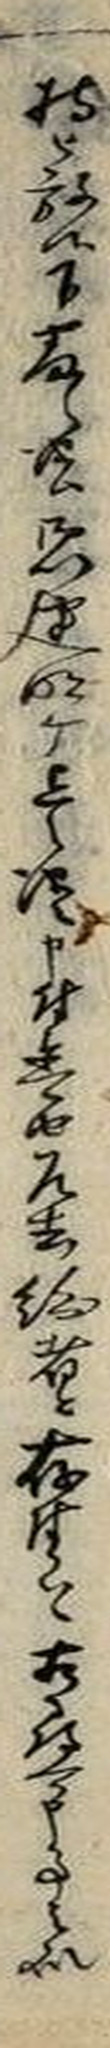持被放候下番之儀は御門建明ケ迄之儀ニ申付置候由乍去紛者と存付候はゝ相尋可申事に候処
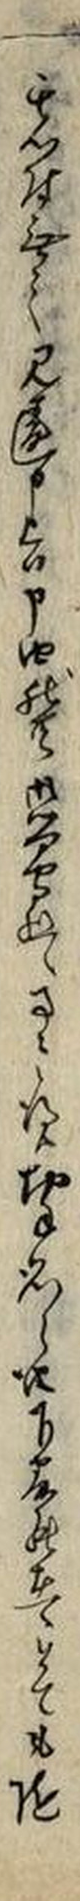其心付無之見違申旨申由然共御留守組之事に候得は切手御門之儀下番罷在候とても随
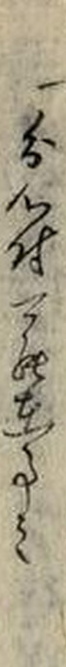分心付可罷在事に候
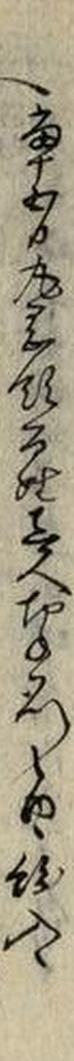当十五日丸岡領百姓壱人切手御門之内へ紛入候
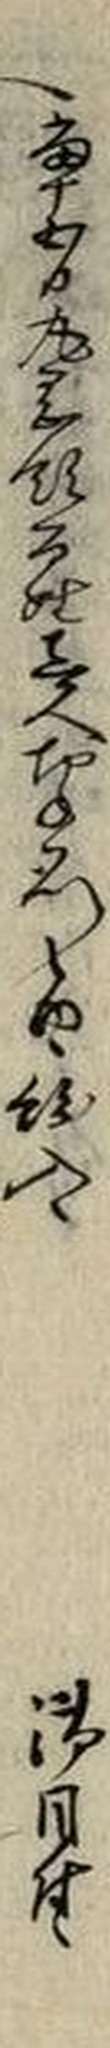当十五日丸岡領百姓壱人切手御門之内へ紛入候
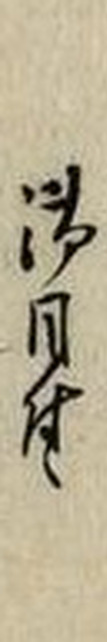御目付へ
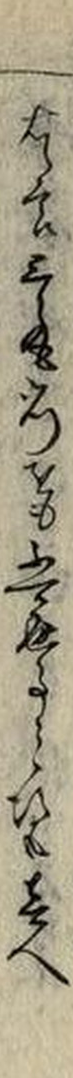右之節三之丸御門をも不可通候事に候得共壱人
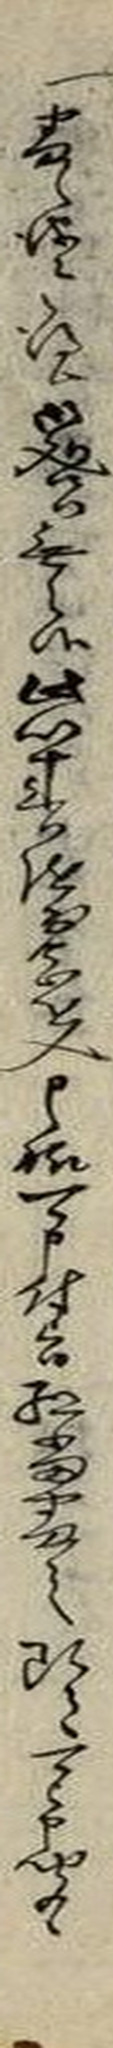番之儀に候得は御咎無之候此以来ハ随分念を入申様可申付旨組当番之頭々可申聞候
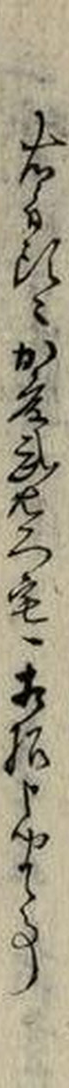右二付頭々加藤武左衛門宅へ相招申聞候事
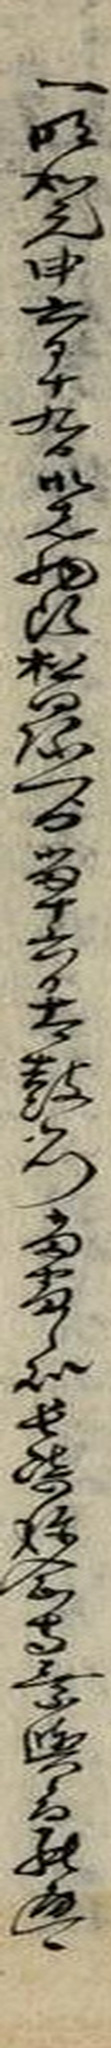一明和元申六月十九日御先物頭松田弥一右衛門当十六日太鼓御門当番之処長崎称念寺乗輿に而罷通候
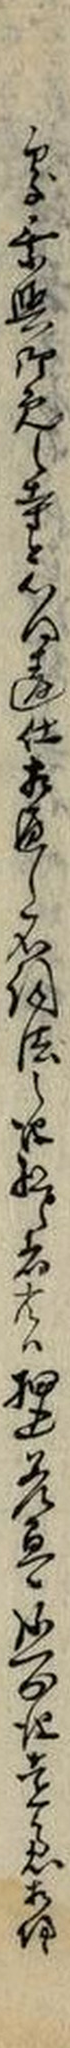処乗輿御免之寺と心得違仕相通し不調法之儀組之者共は押込差置候弥一右衛門儀遠慮相伺候
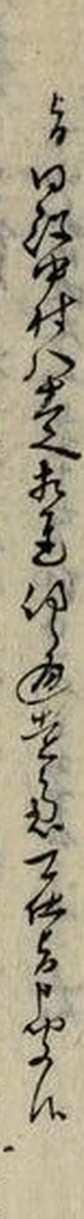旨同役中村八太夫相達伺之通遠慮可仕旨申聞候
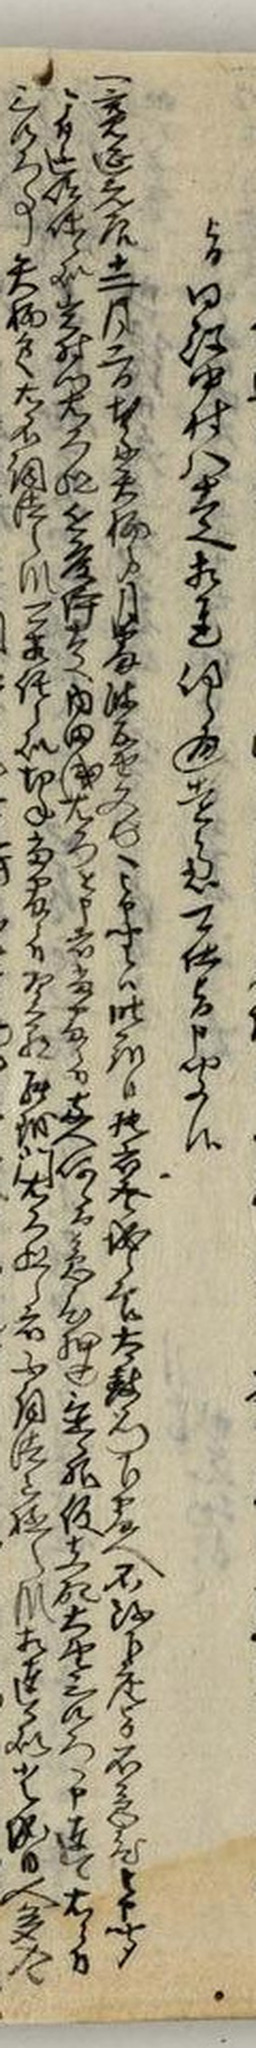一寛延元辰十二月二日本多矢柄方月番波多野文右衛門へ被申聞候は昨朔日拙者登城之節太鼓御門下番人不致下座旨不急度被申聞
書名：御門御櫓之部
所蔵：福井県文書館 Fukui Prefectural Archives
